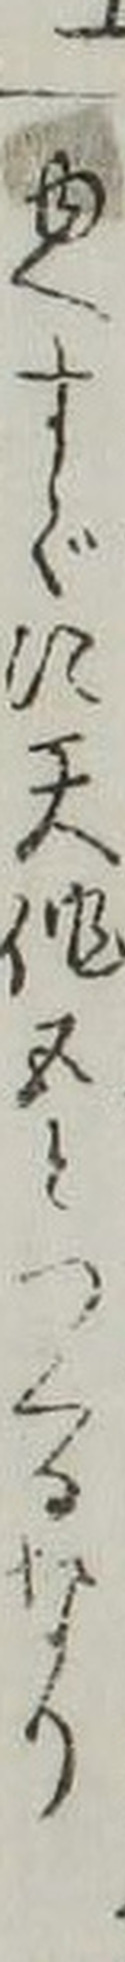ゆへすぐに天作五とつくるなり
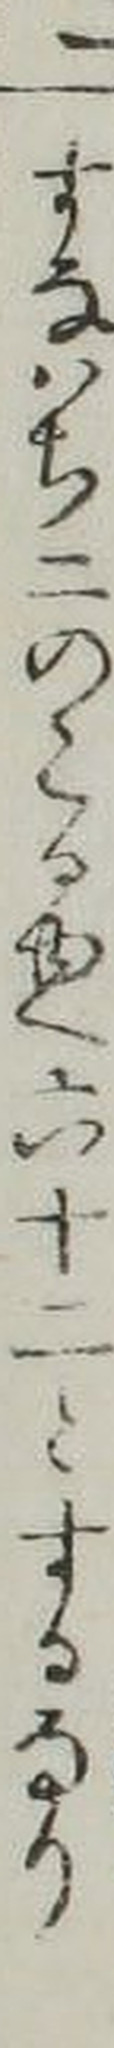すなはち二のこるゆへ六十二とするなり
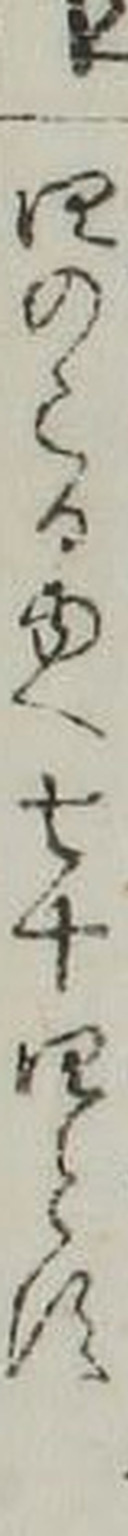四のこるゆへ七十四とす

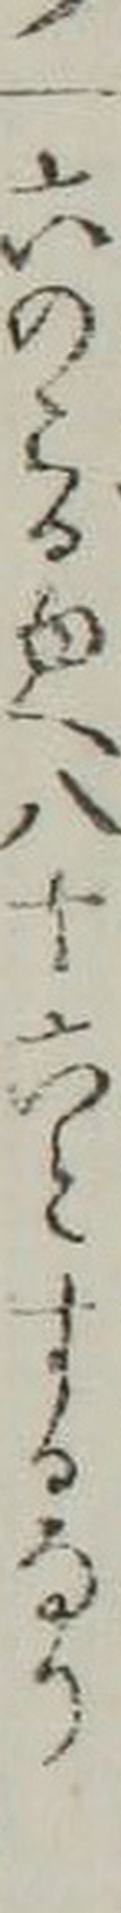六のこるゆへ八十六とするなり
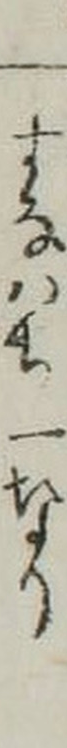すなはち一なり
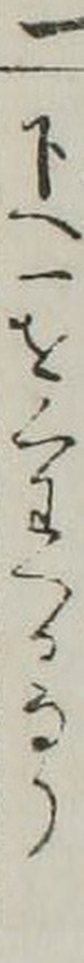下へ一をくわへるなり
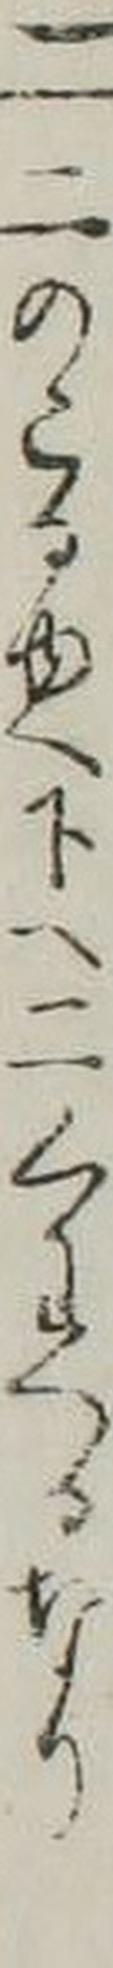二のこるゆへ下へ二くわへるなり
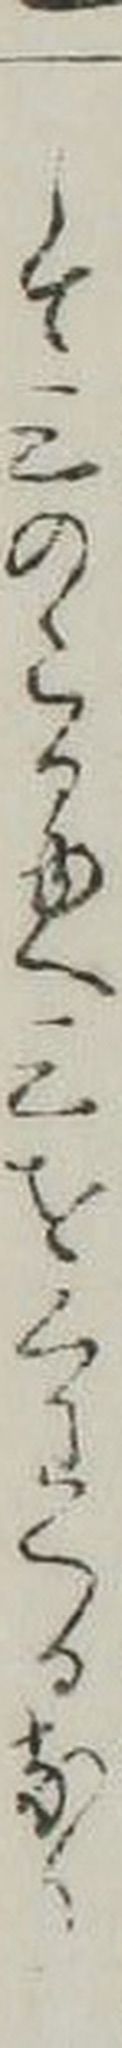して三のこるゆへ三をくわへるなり
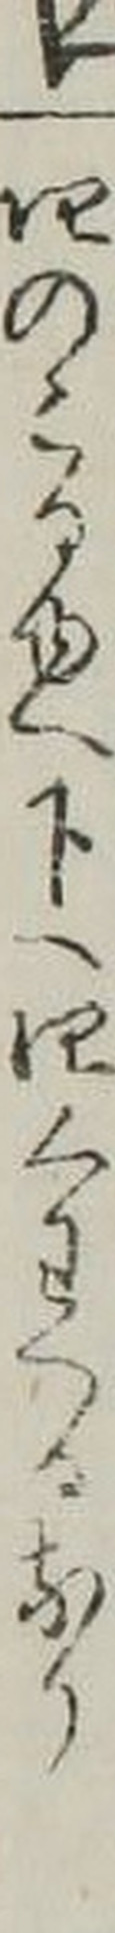四のこるゆへ下へ四くわへるなり
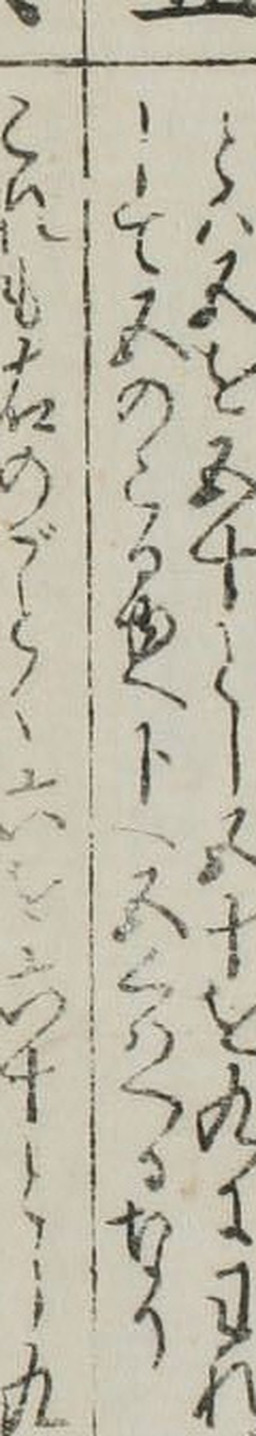して五のこるゆへ下へ五くはへるなり
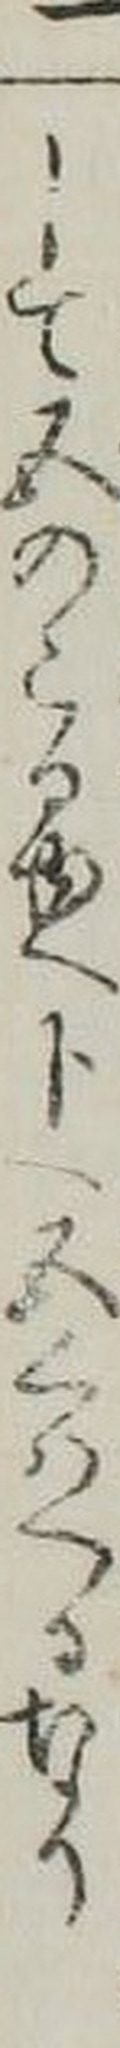して五のこるゆへ下へ五くはへるなり
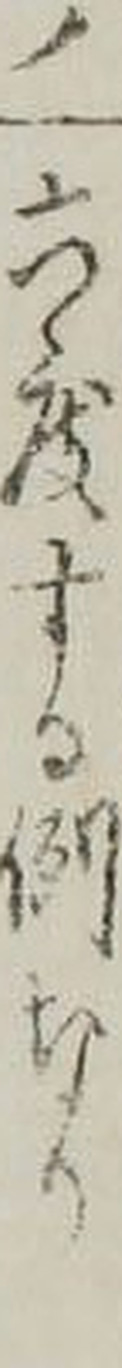六度する例なり
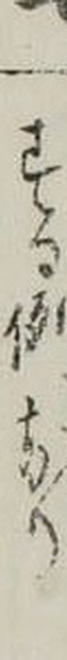する例なり
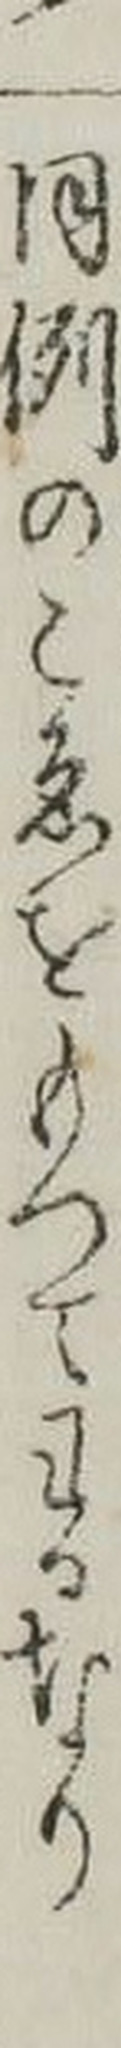同例のこゑをもつてわるなり
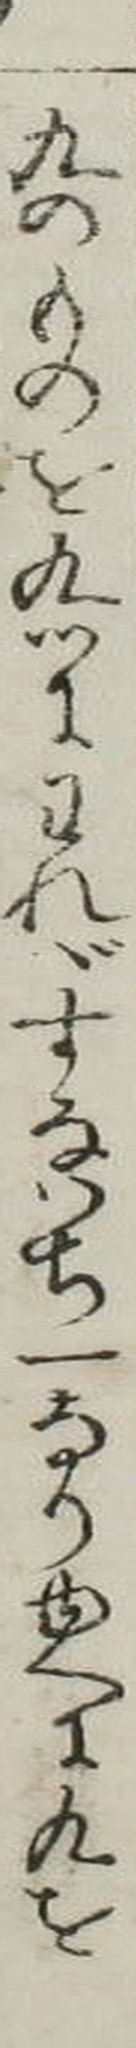九進一十九のものを九ツにわればすなはち一なりゆへに九を
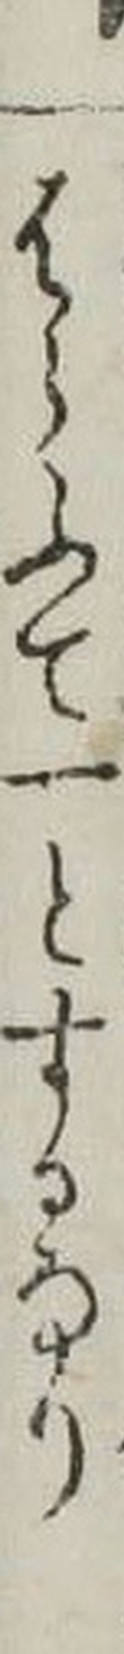はらふて一とするなり
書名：宝玉塵劫記
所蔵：東京学芸大学教育コンテンツアーカイブ
